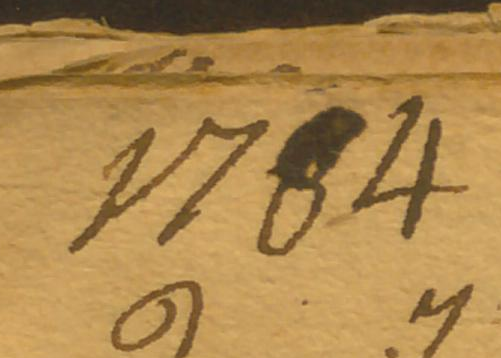1784
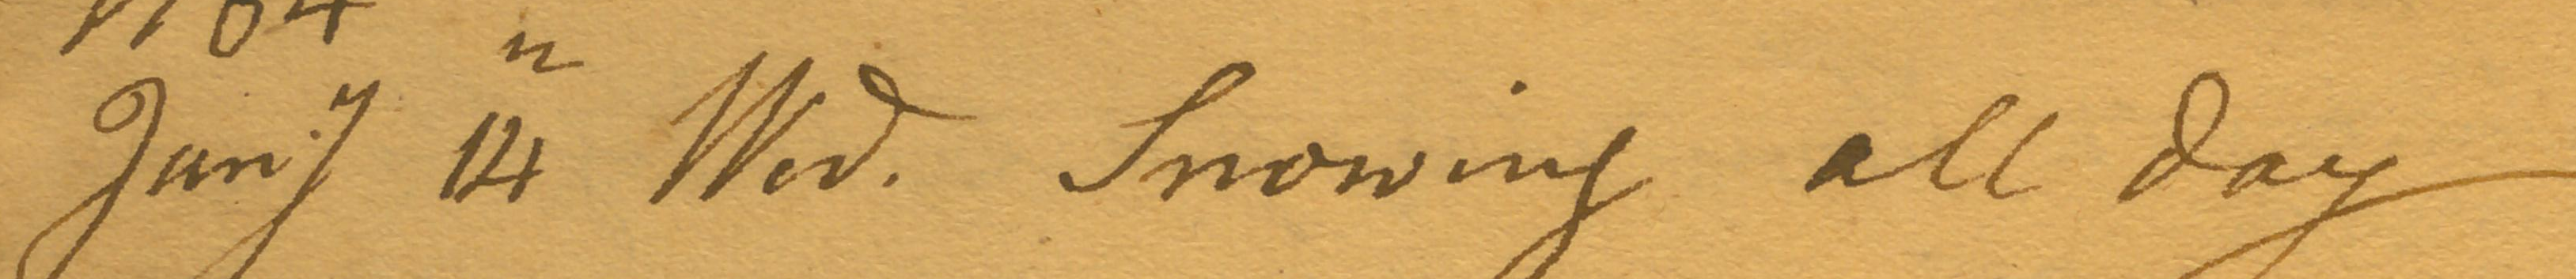Jan^y. 14^th Wed. Snowing all day
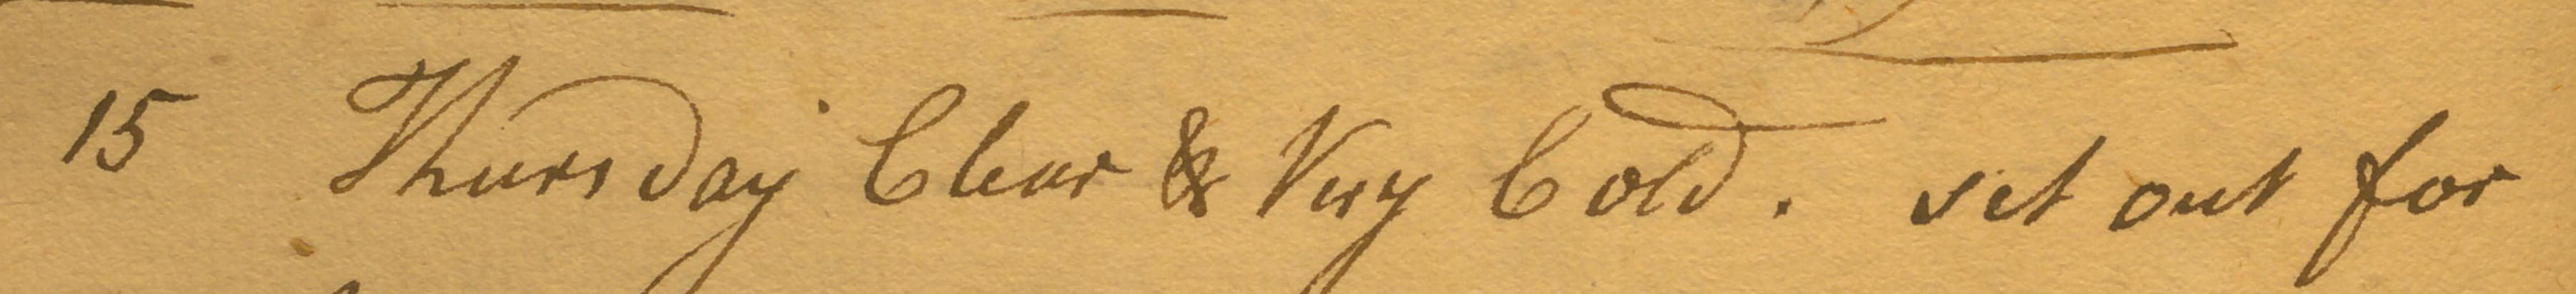15 Thursday Clear & Very Cold. set out for
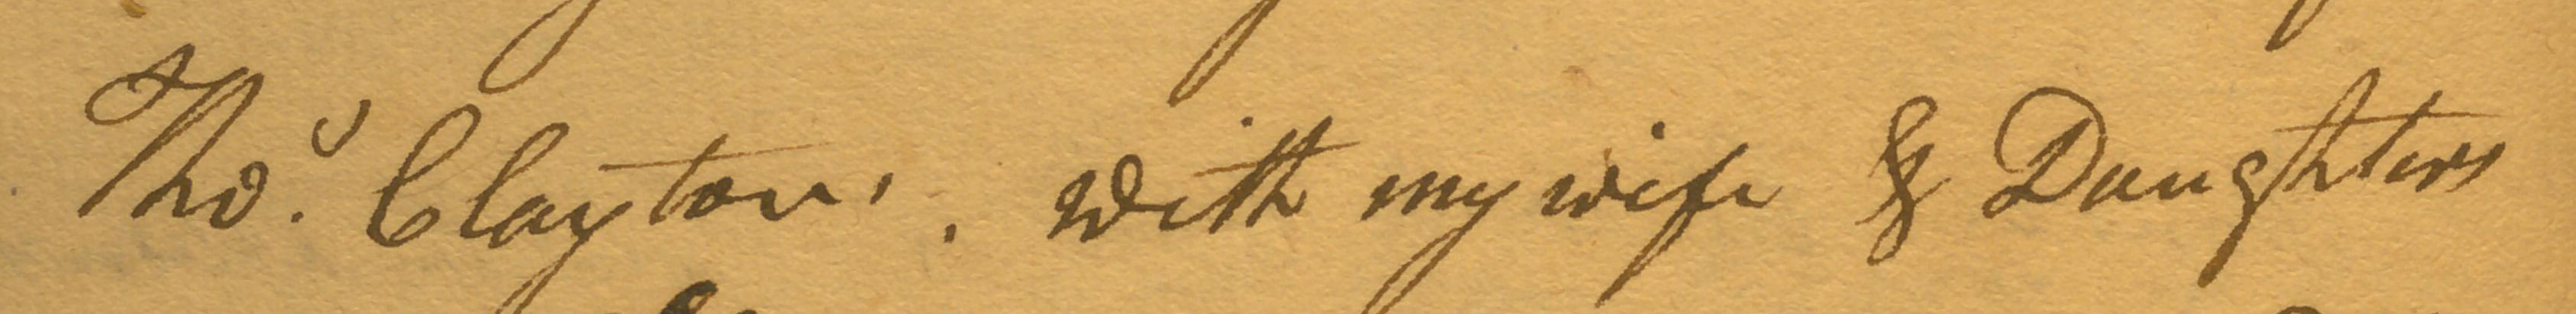Tho^s. Claytons, with my wife & Daughters
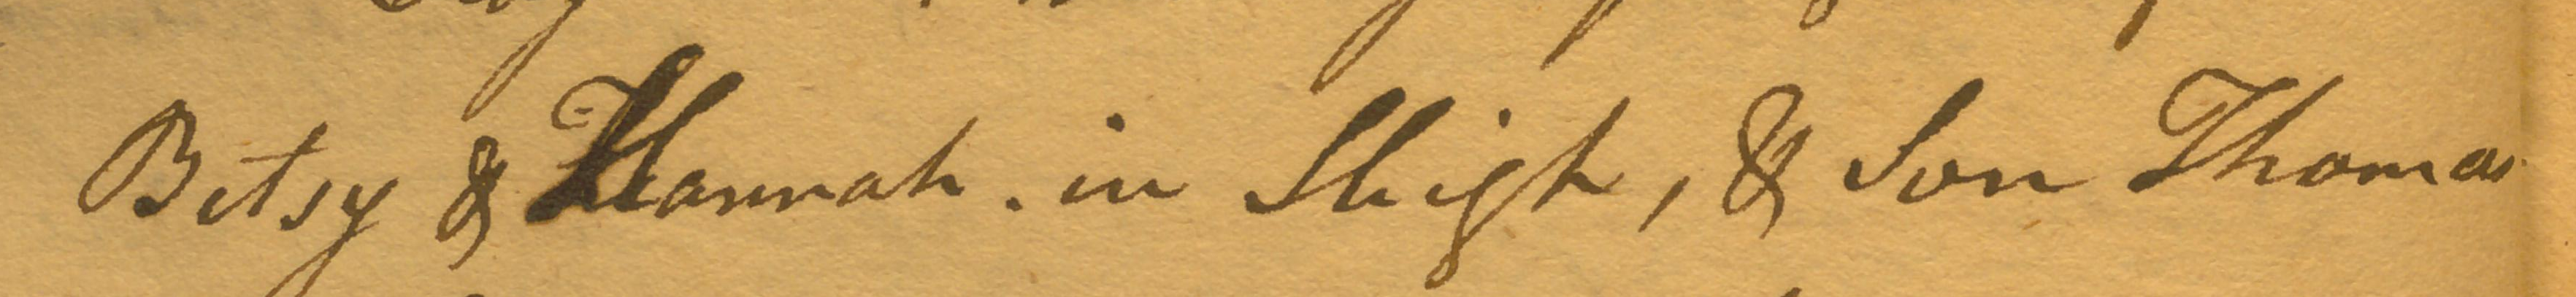Betsy & Hannah in Sleigh, & Son Thomas
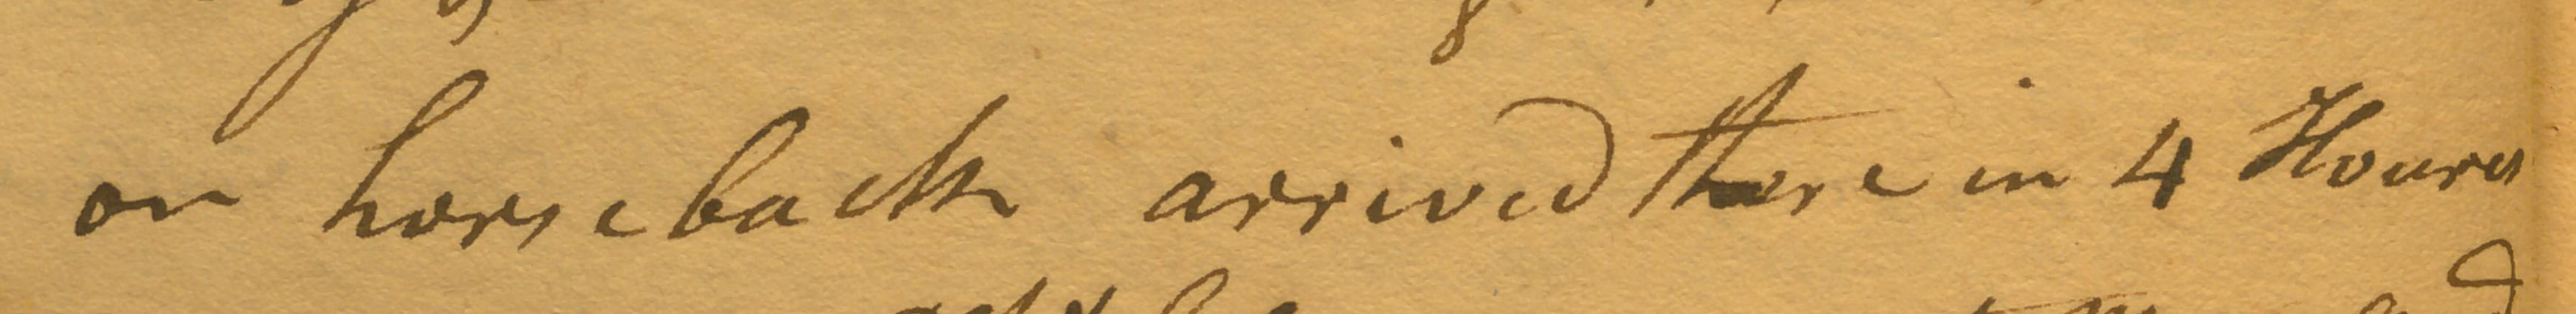on horseback arrived there in 4 Houres
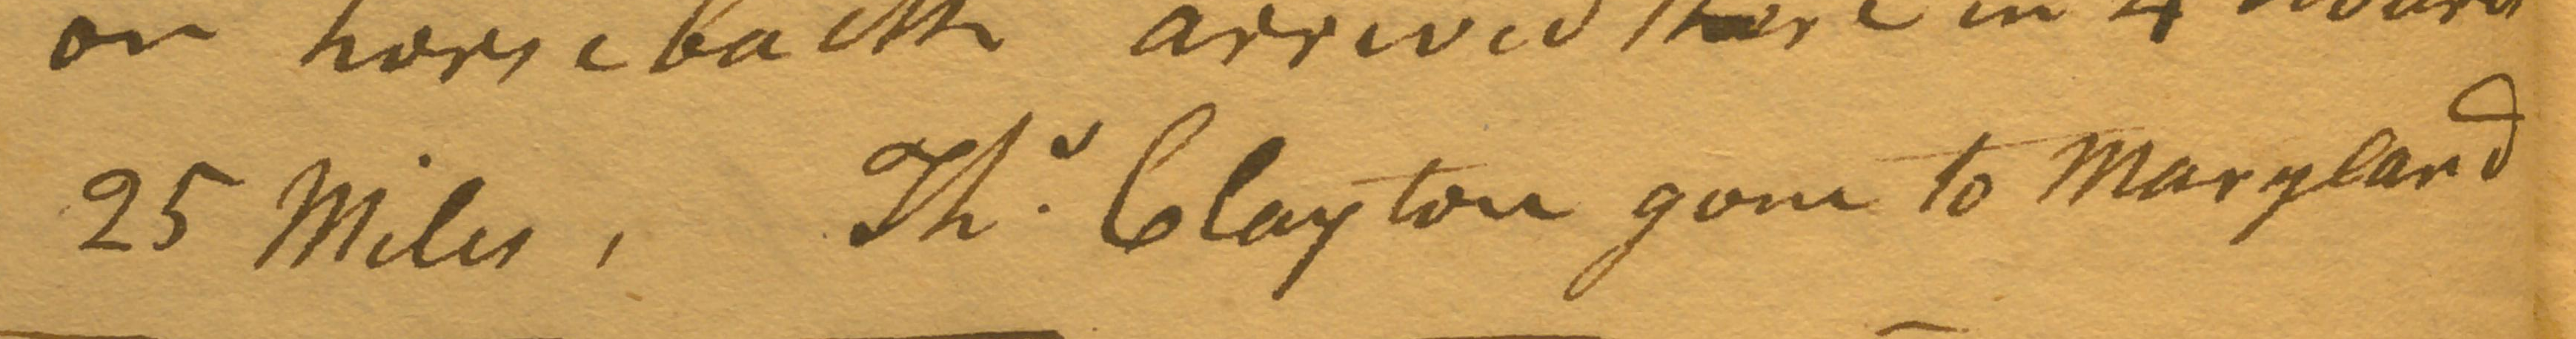25 Miles, Th^s. Clayton gone to Maryland
